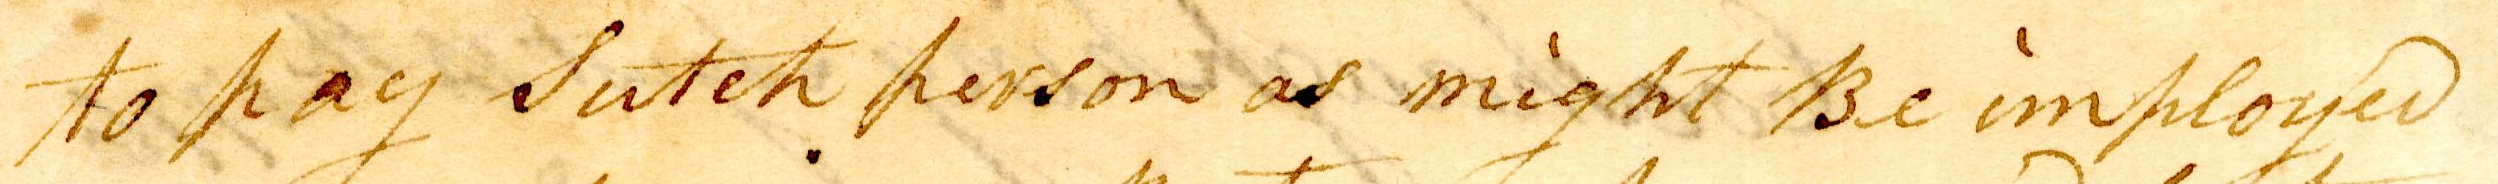to pay Sutch person as might Be imployed
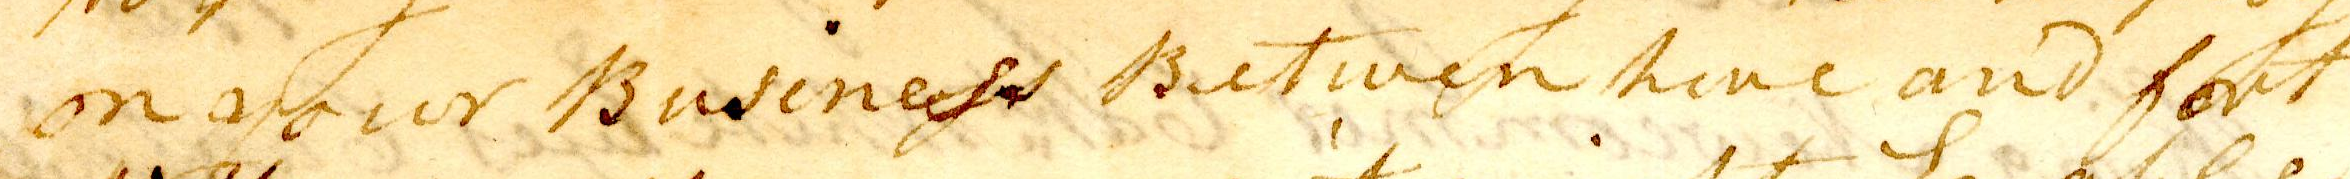on your Business Betwen here and fort
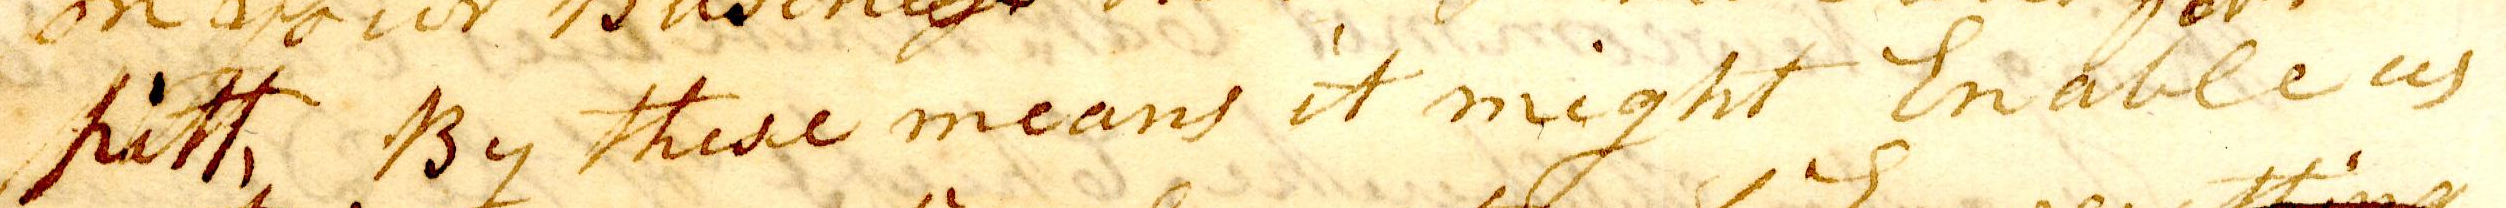pitt. By these means it might Enable us
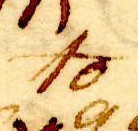to
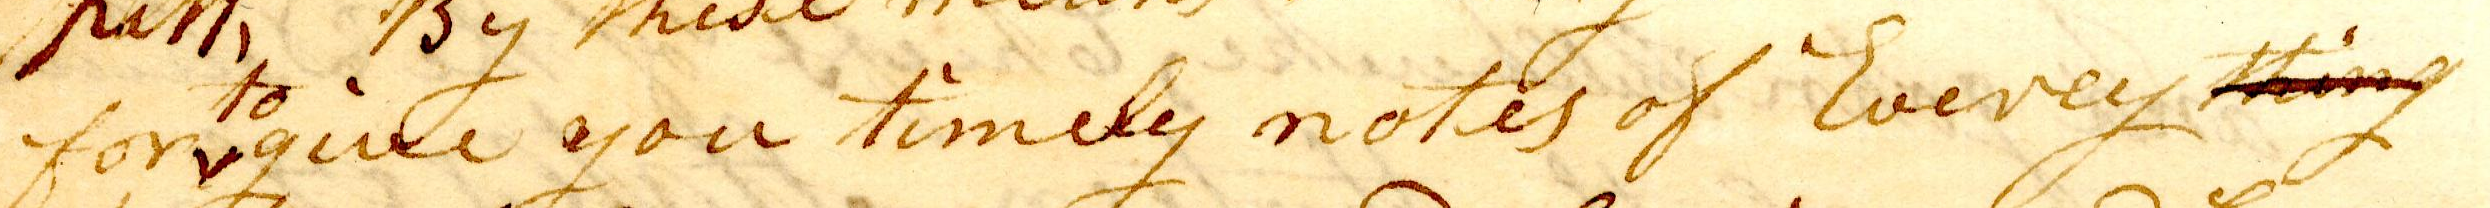for ^ give you timely notes of Everey [thing]
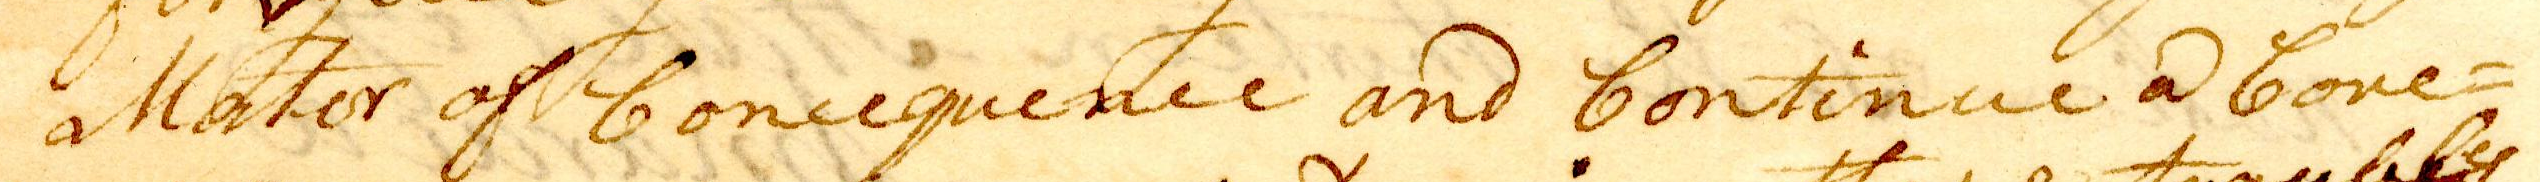Matter of Concequence and Continue a Core-
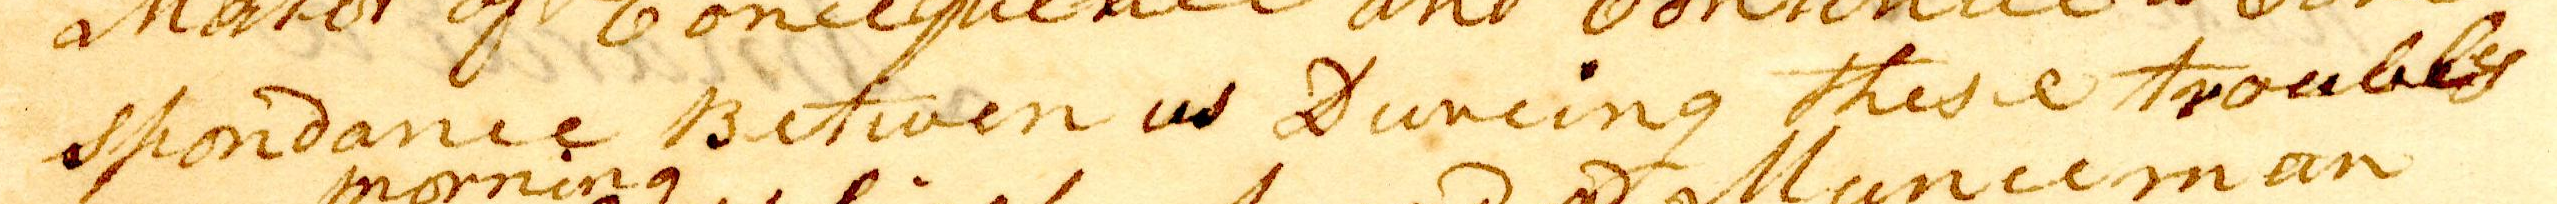-spondance Betwen us During these troubles
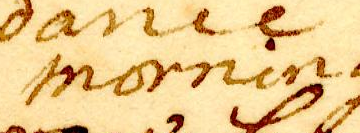morning
